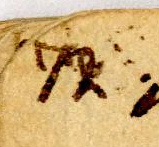72
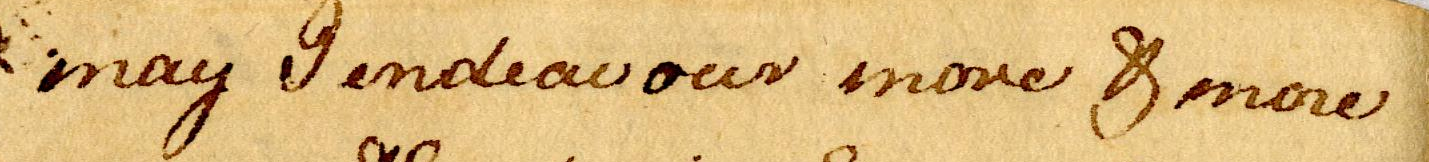may I endeavour more & more
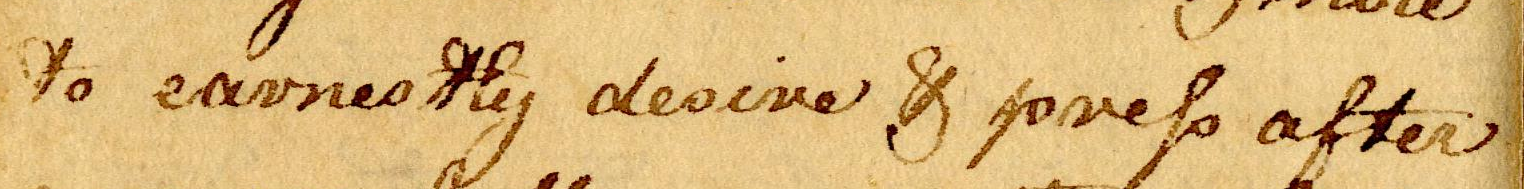to earnestly desire & press after
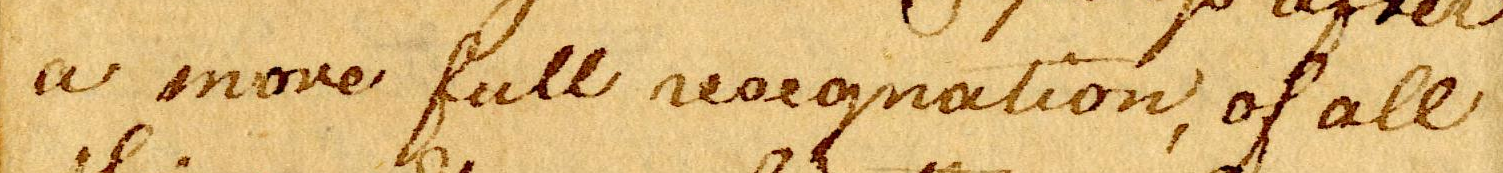a more full resegnation of all
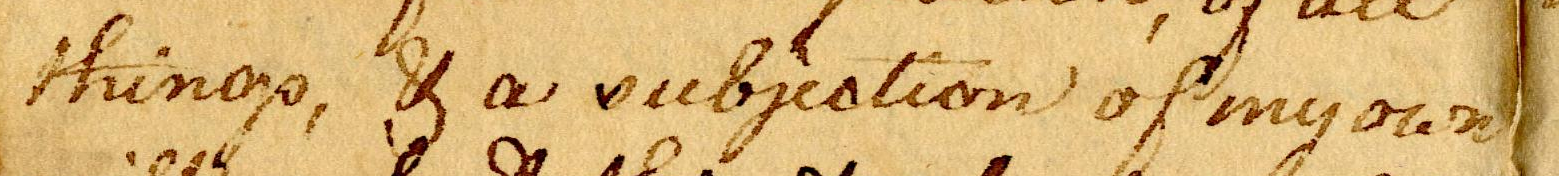things, & a subjection of my own
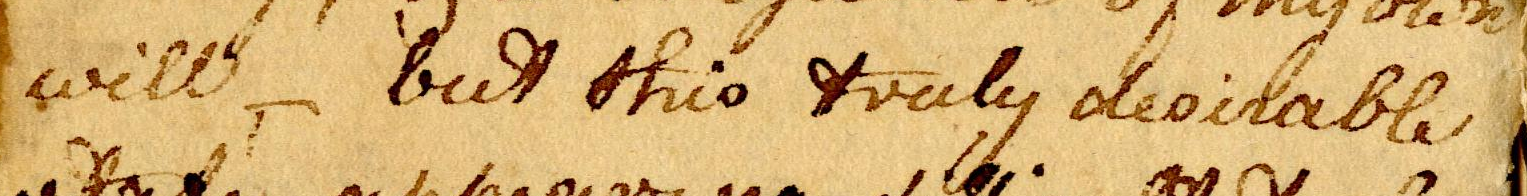will- but this truly desirable
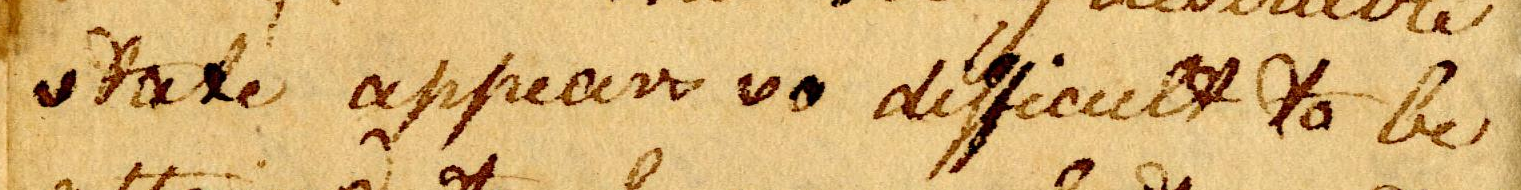state appears so difficult to be
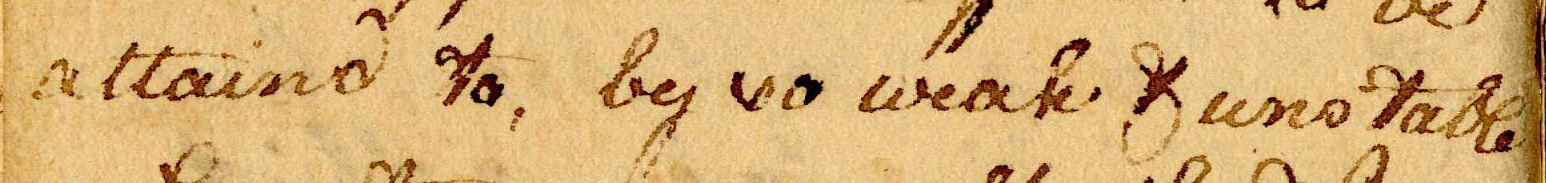attaind to, by so weak & unstable
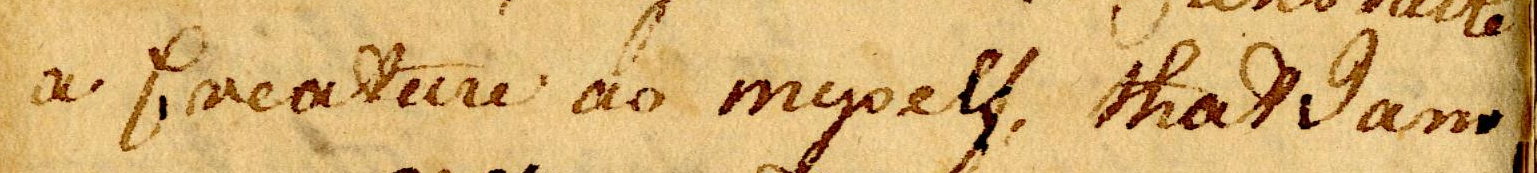a Creature as myself, that I an
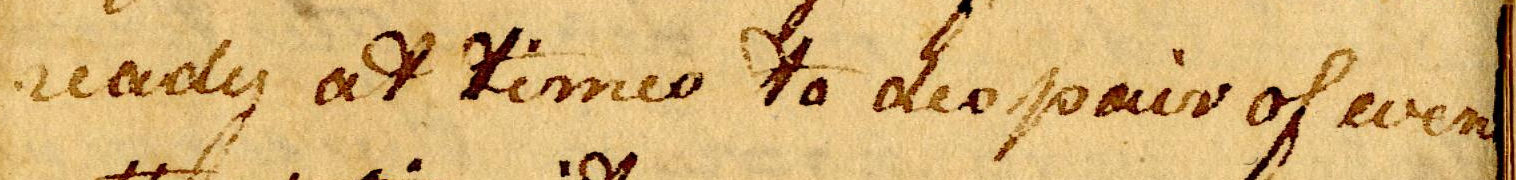ready at times to despair of even
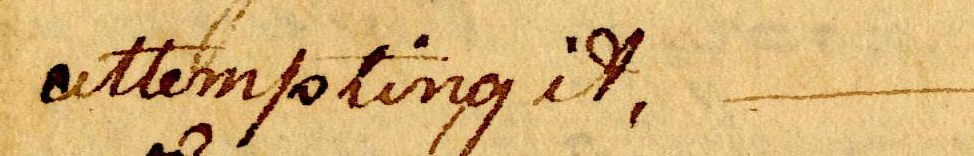attempting it-
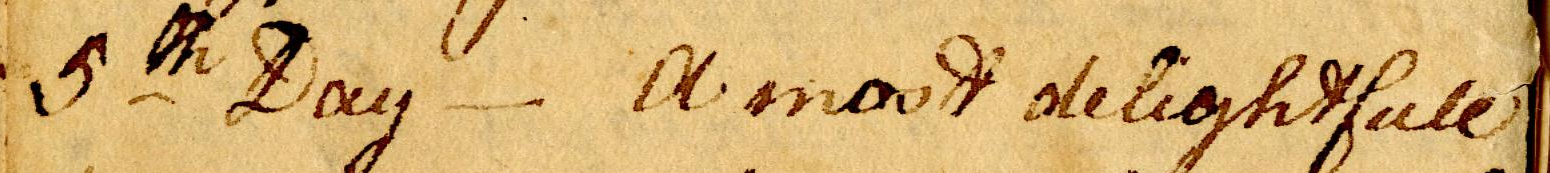5^th Day- A most delightfull
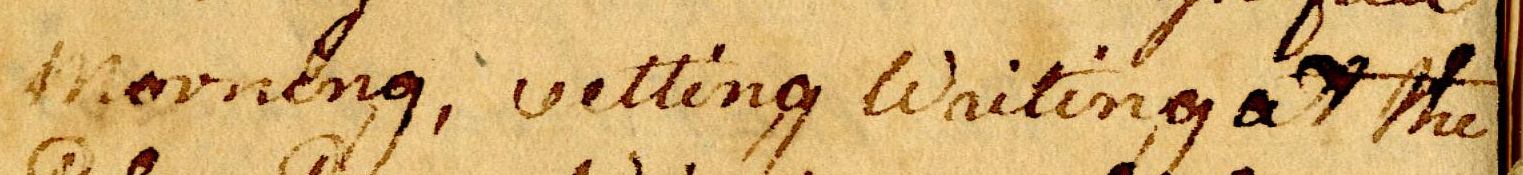Morning, setting Writing at the
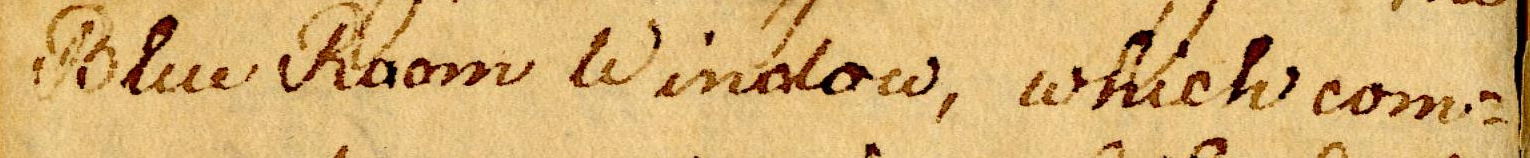Blue Room Window, which com-
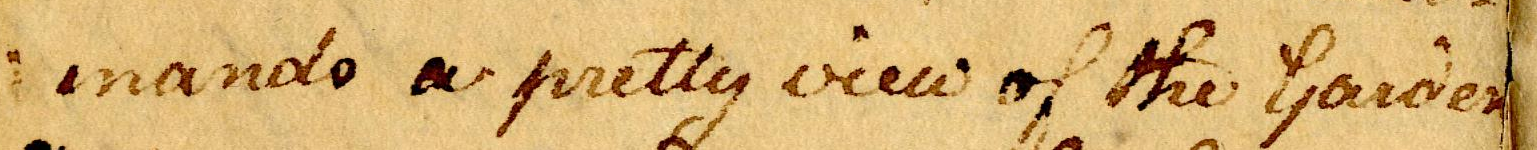mands a pretty view of the Garden
